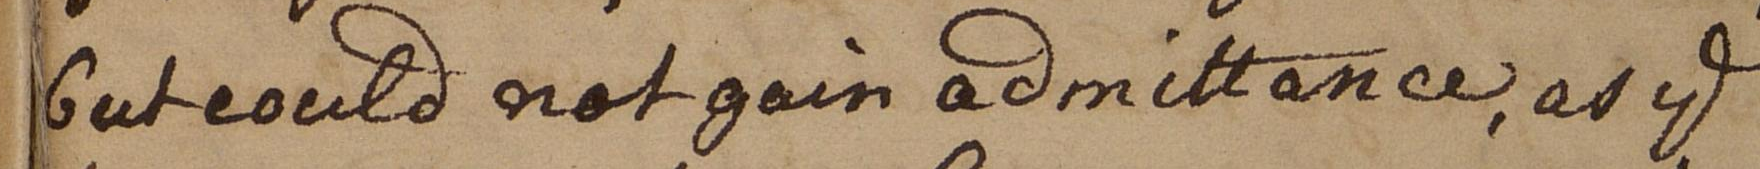but could not gain admittance, as y^e
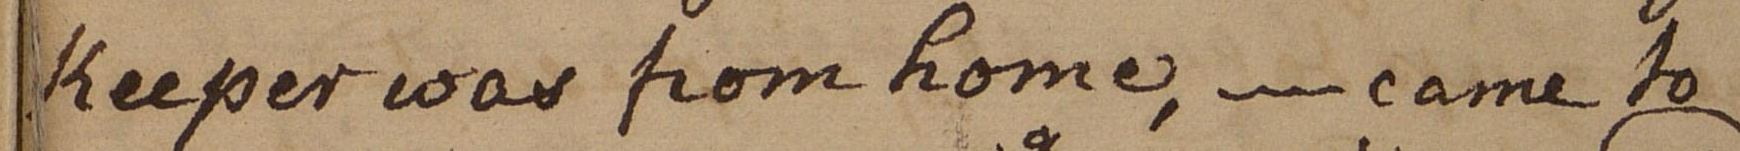keeper was from home,- came to
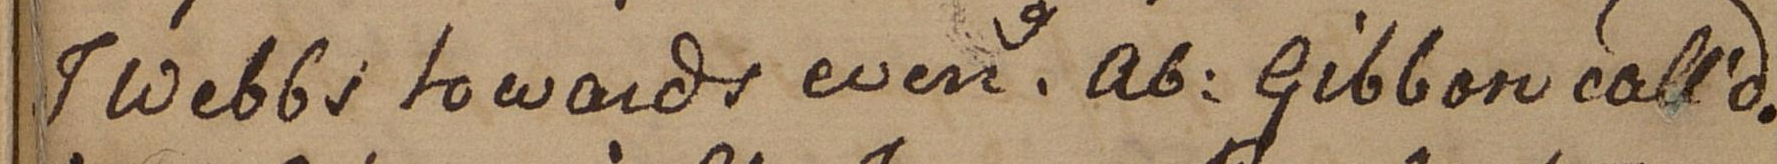T Webbs towards even^g. Ab: Gibbon call'd.
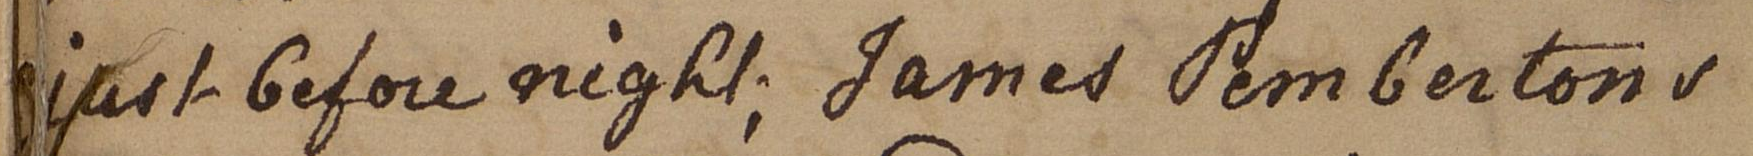just before night; James Pembertons
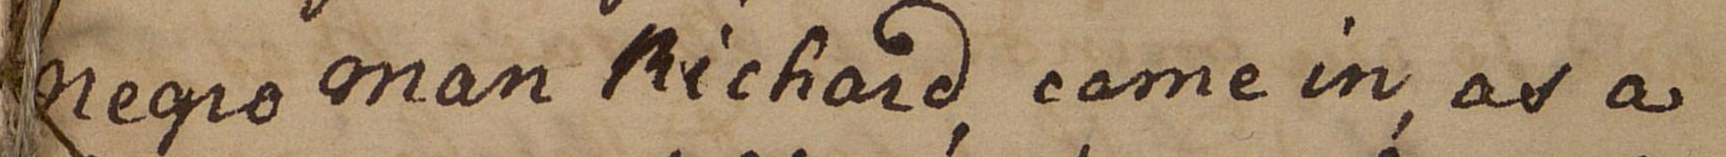Negro man Richard, came in, as a
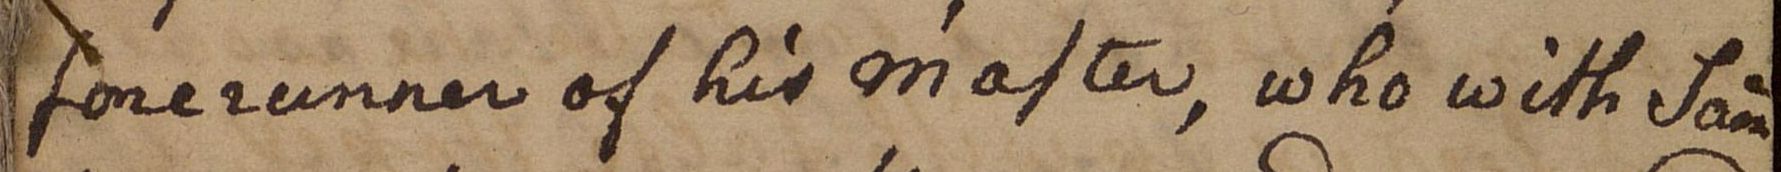forerunner of his master, who with Sam^l
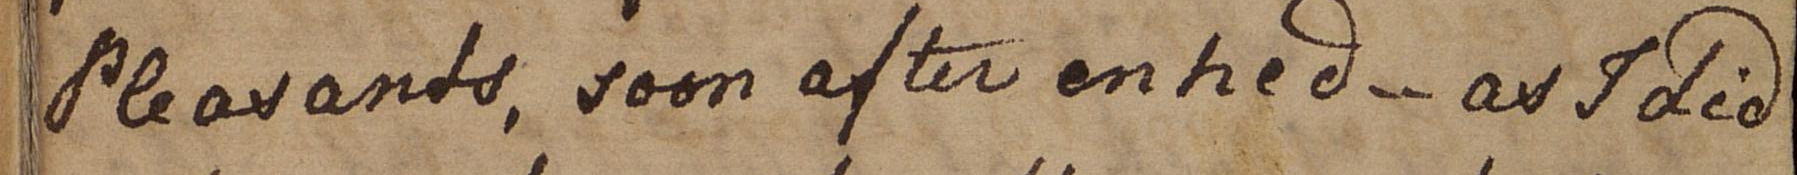Pleasants, soon after entied- as I did
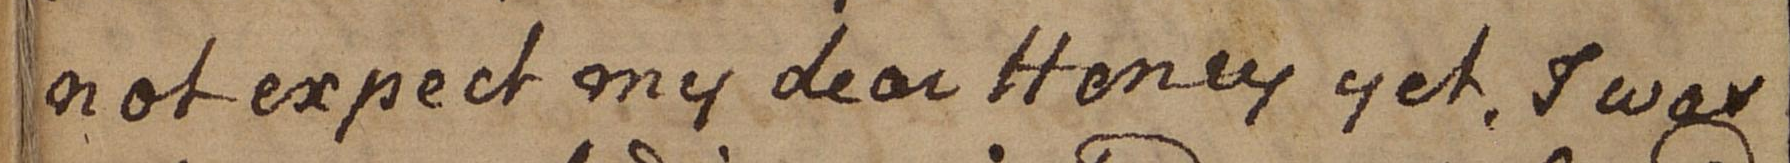not expect my dear Henry yet. I was
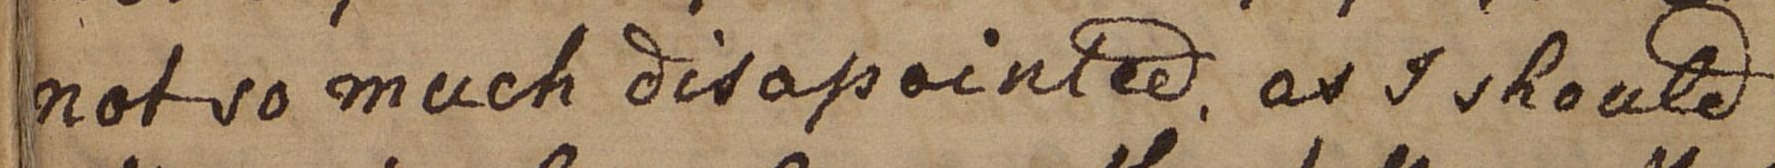not so much disapointed, as I should
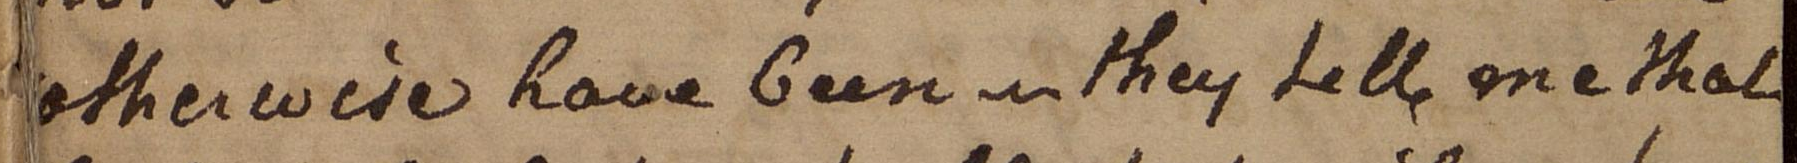otherwise have been- they tell, me that
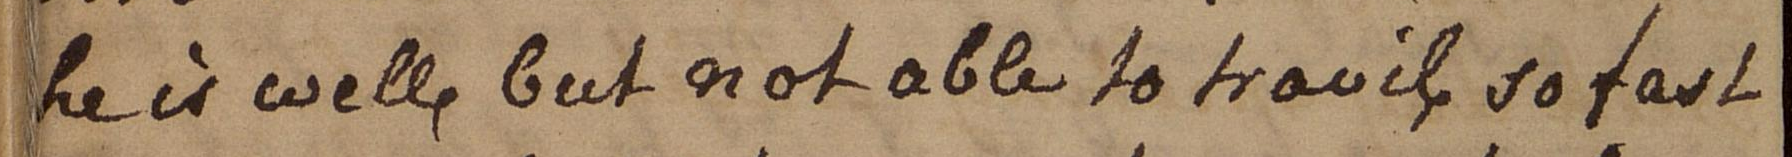he is well, but not able to travil so fast
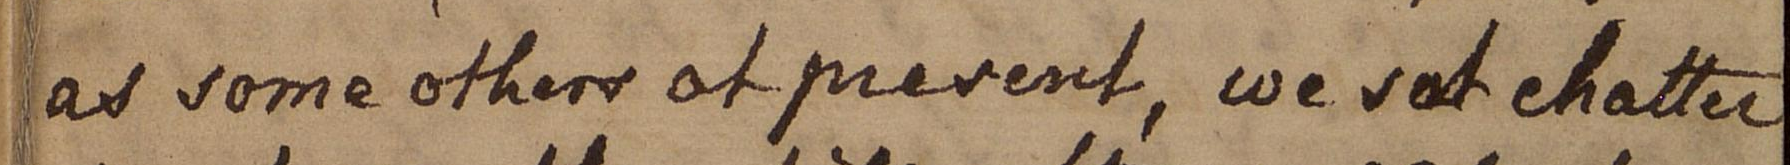as some others at present, we sat chatter
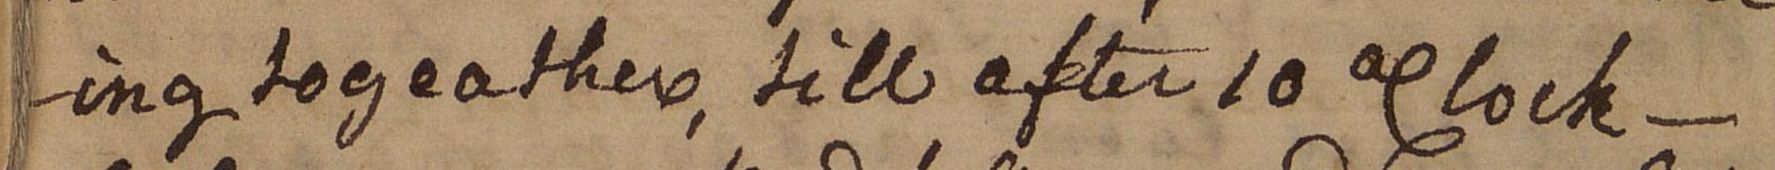-ing togeather, till after 10 ^o Clock-
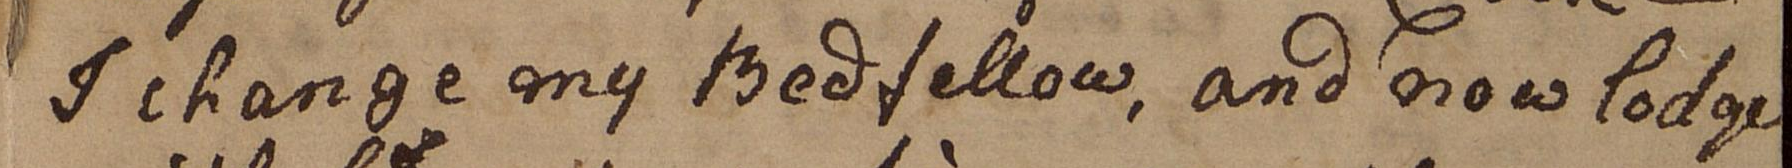I change my Bedfellow, and now lodge
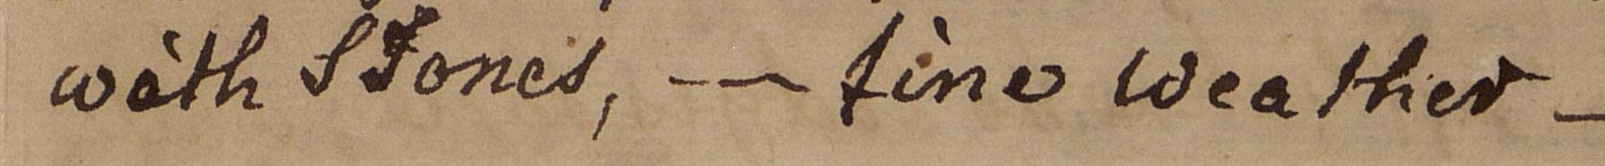with S Jones,-- fine Weather-
